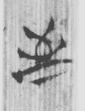至
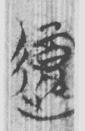復
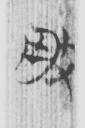般
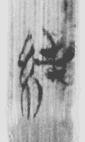純
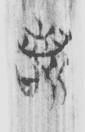若
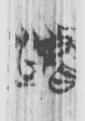濬
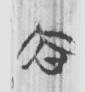去
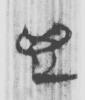兇
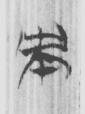央
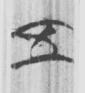一
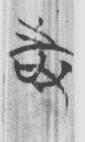𠱾
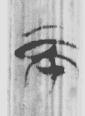不
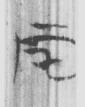厇
